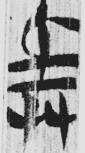與（與）
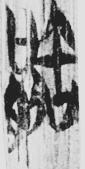○（鮑）
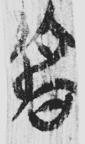○（叔）
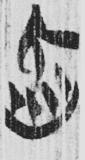○（牙）
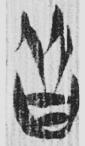皆
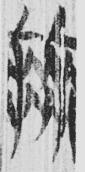拜
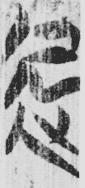○（起）
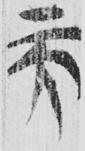而
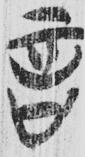言
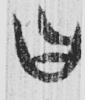曰
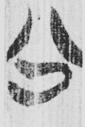公
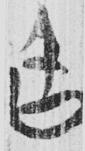身
